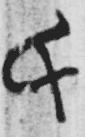氏
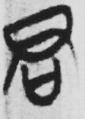君
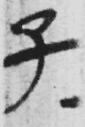子
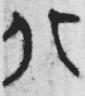北
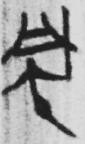風
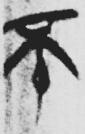不
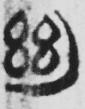○（絕）
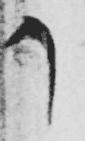人
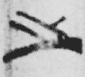之
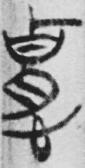惋（怨）
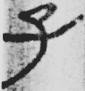子
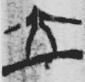立
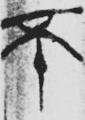不
